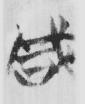咸
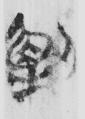解
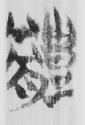體
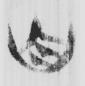自
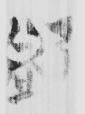卹
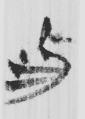此
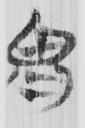胃
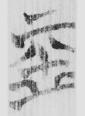亞
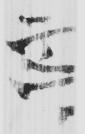正
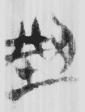型
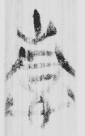情
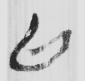㠯（以）
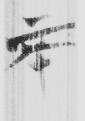不
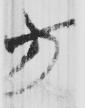方
